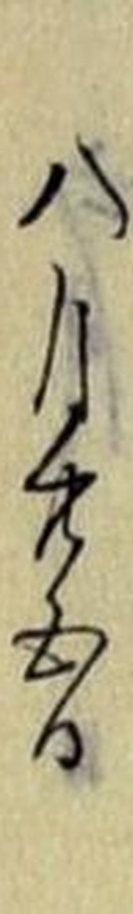八月廿五日
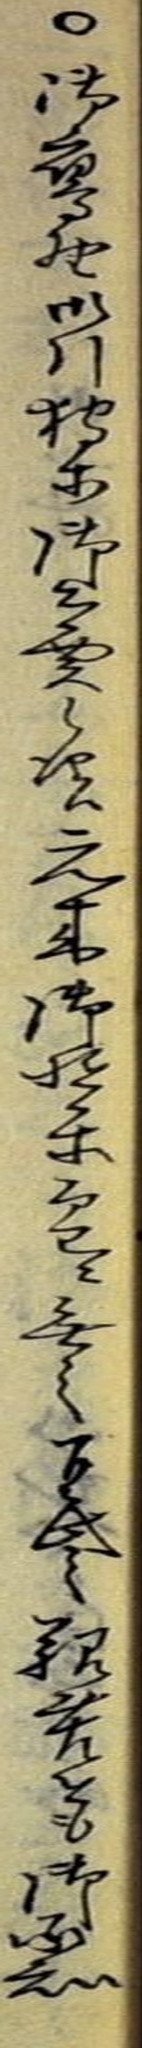〇御鷹野御川狩等御出殿之儀ハ元来御遊楽而已ニ無之下民之難苦とも御承知
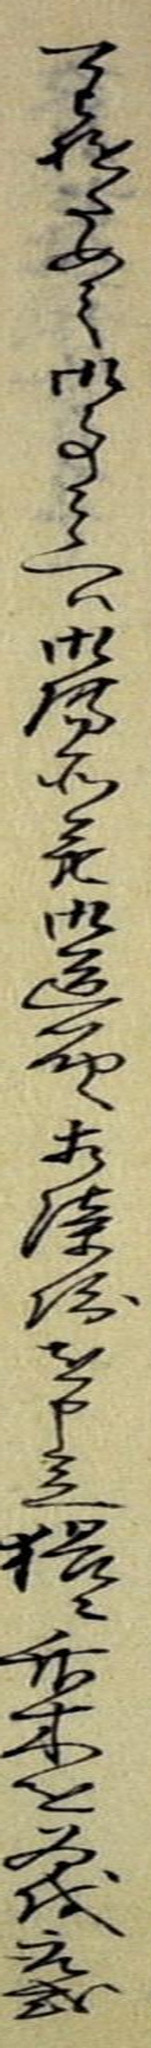可被遊ため之御事ニ候へハ御場所并御道筋へ相障儀を申立猥ニ竹木を為代取或
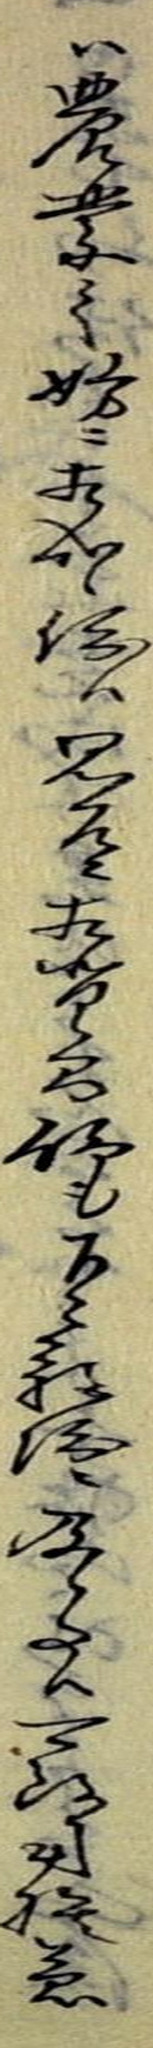ハ農業之妨ニ相成候儀ハ思召ニ相背候間聊も下々難儀ニ及事ハ可致用捨兼
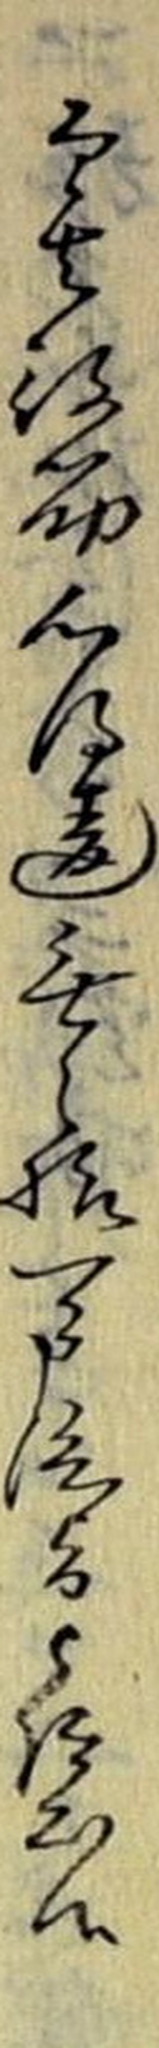而其役筋心得違無之様可申渡旨被仰出候
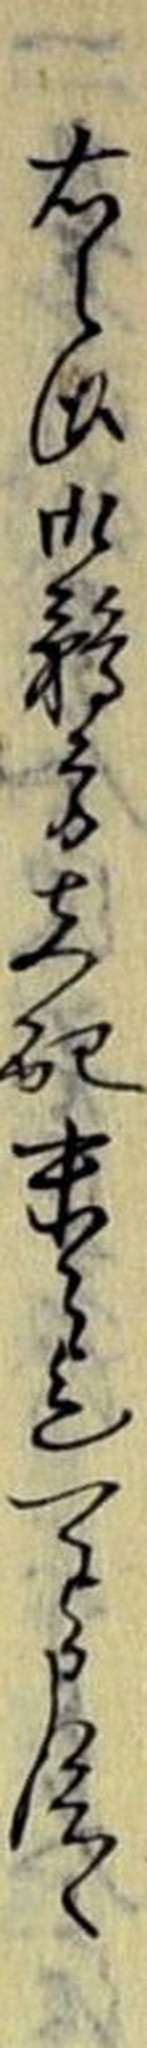右之趣御鵜方支配末々迄可被申渡候
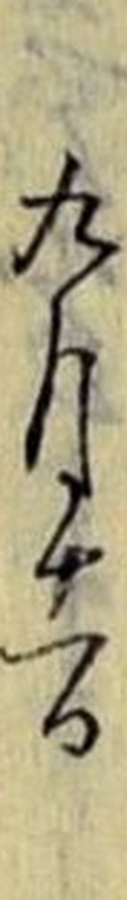九月十一日
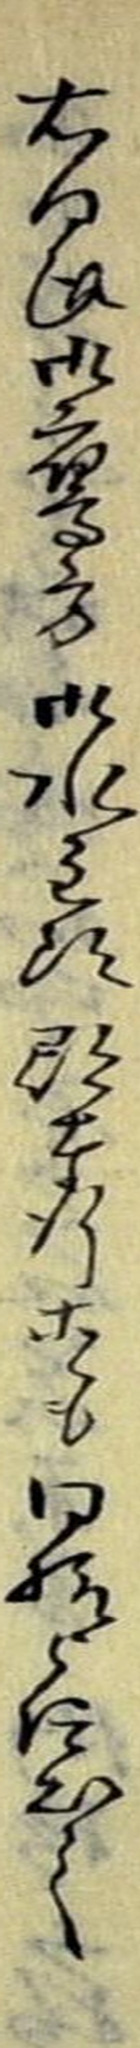右同趣御鷹方御水主頭郡奉行等へも同様被仰出之
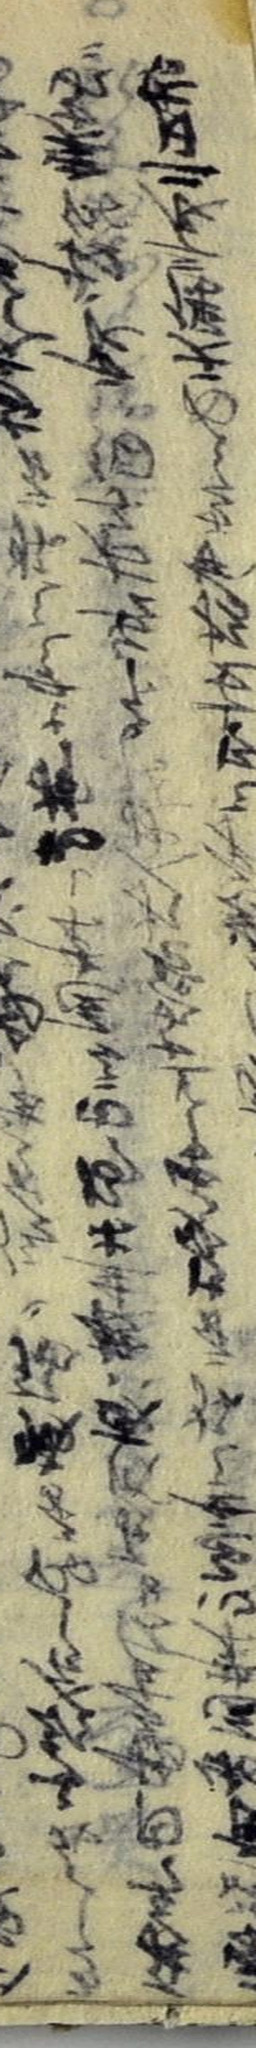九月十一日

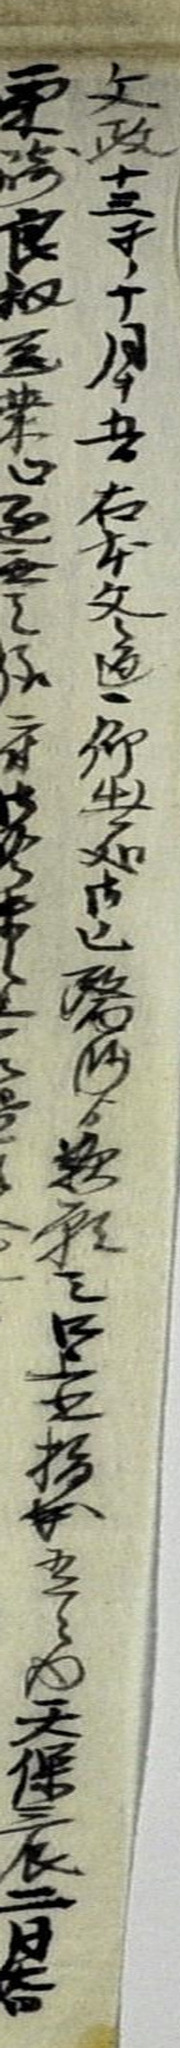文政十三子ノ十月十五日右本文之通被仰出候処御匕医師ゟ歎願之口上書指出有之内天保三辰二月七日
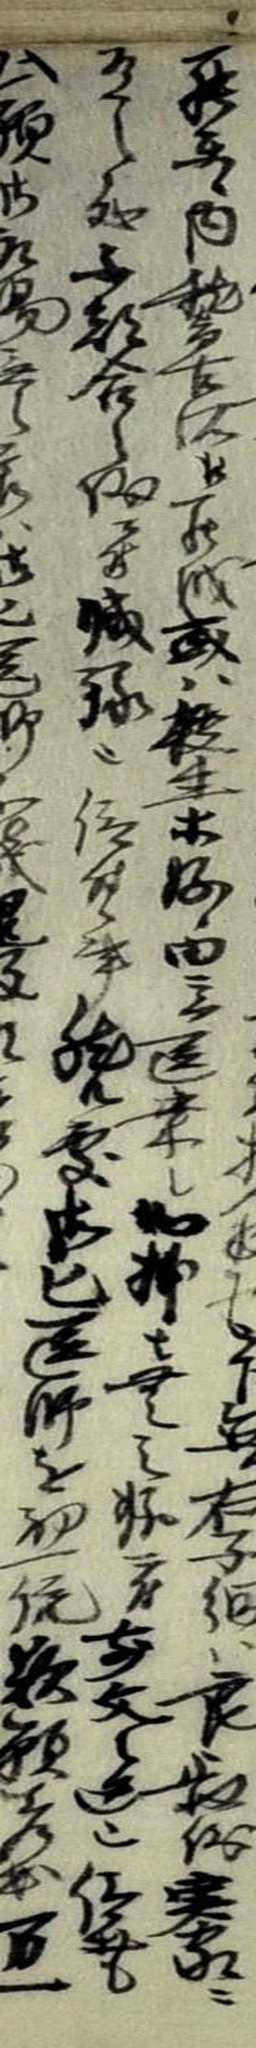有之候処不都合之儀ニ付減録被仰付候事然ル処御匕医師を初一統歎願差出万一
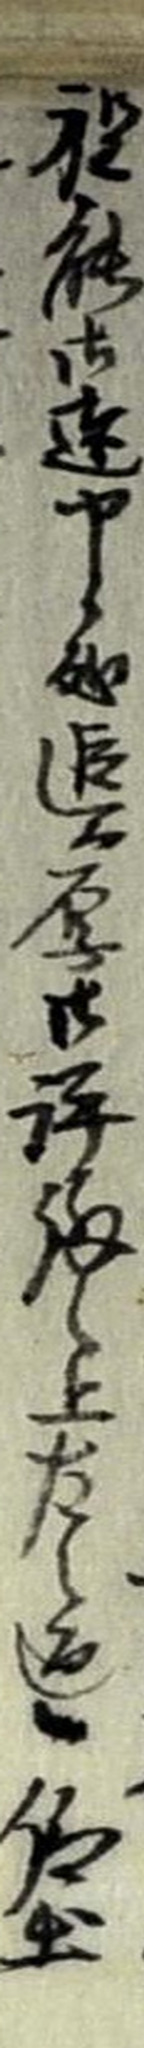程能御達申候処追而厚御評議之上左之通被仰出
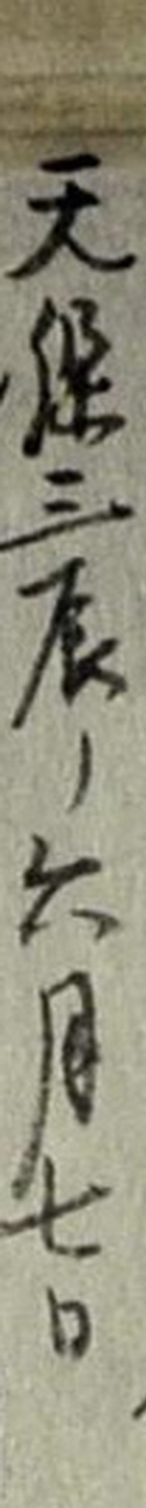天保三辰ノ六月七日
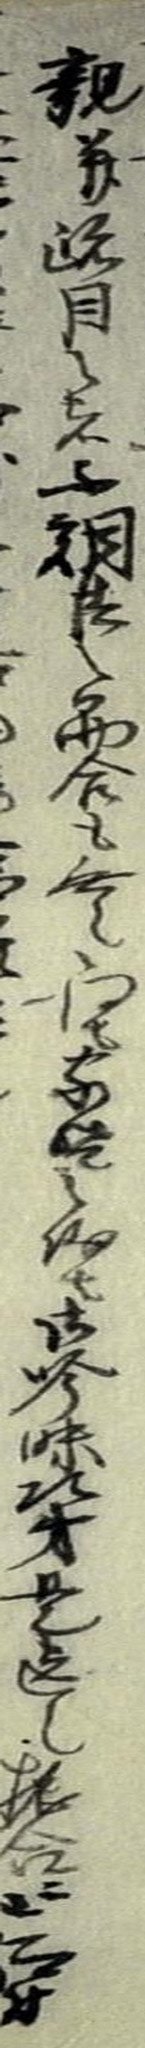親并跡目之者不調法之筋合も無之候得者家督之儀者御吟味次第是迄之振合ニ被仰付
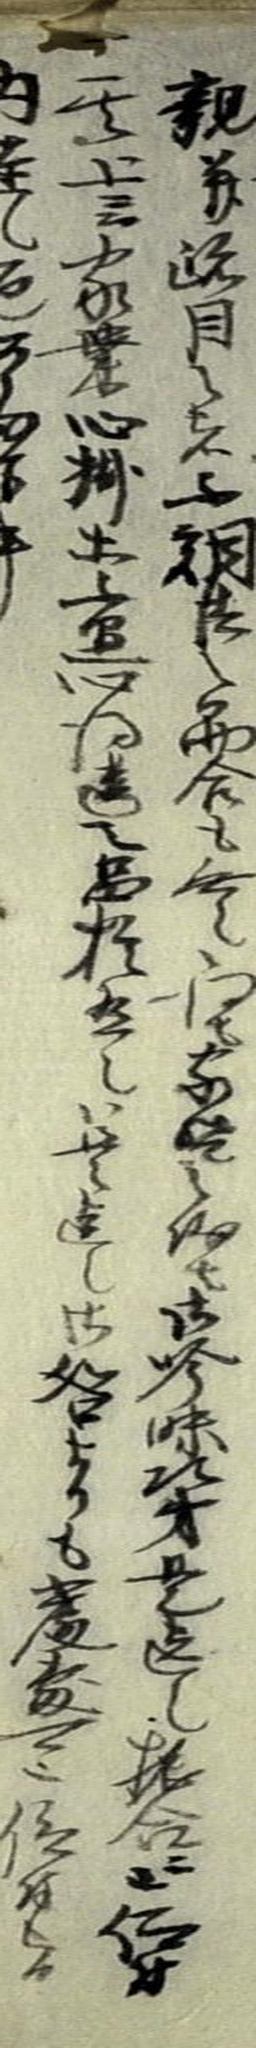其上ニ而家業心掛等不宜心得違之品於有之ハ是迄之御咎よりも厳敷可被仰付旨
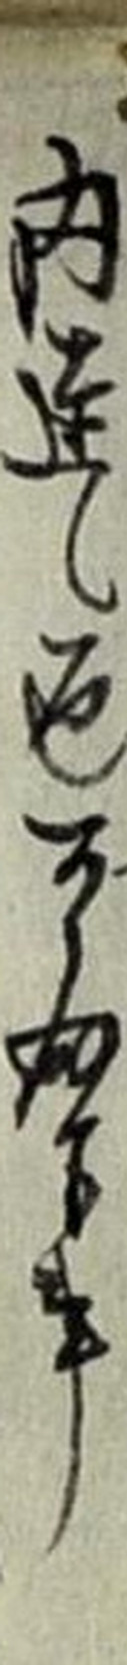内達之通可成下事
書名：命令之部 五
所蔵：福井県文書館 Fukui Prefectural Archives
